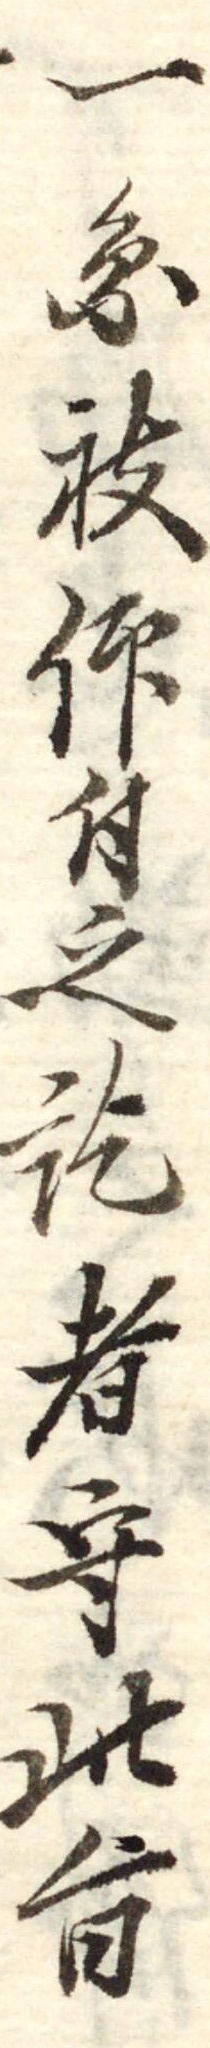一円被仰付之訖者守此旨
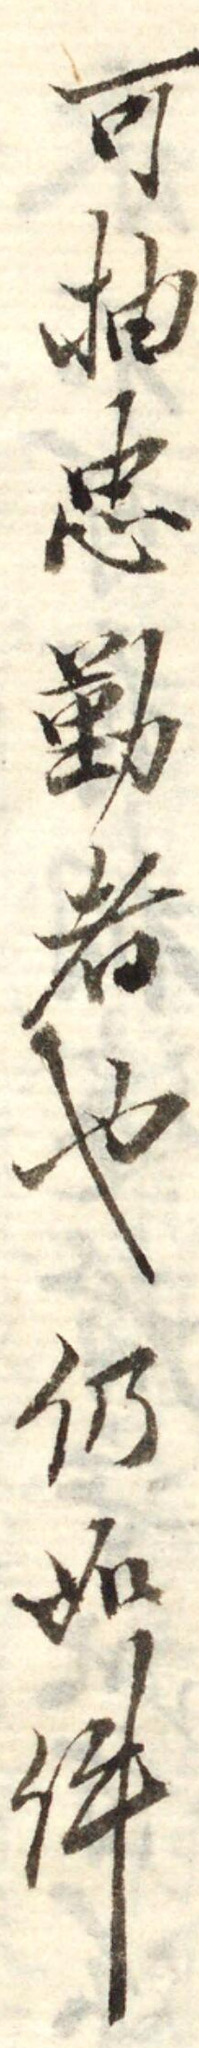可抽忠勤者也仍如件
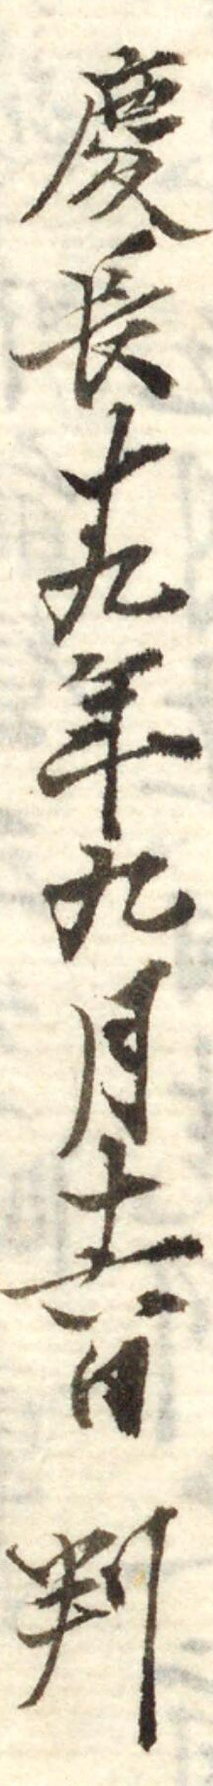慶長十九年九月十六日判
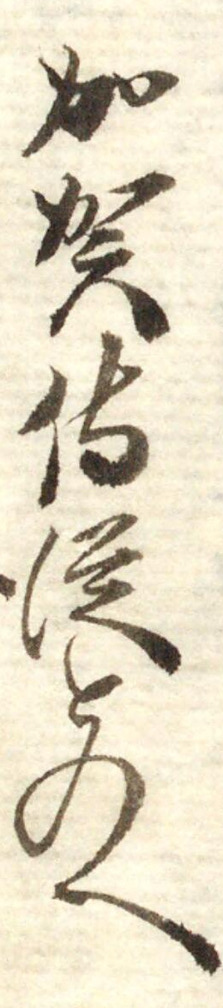加賀侍従とのへ

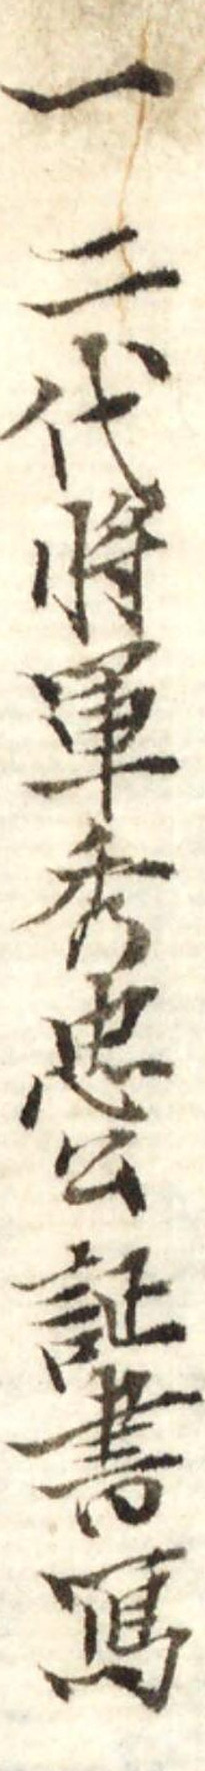一二代将軍秀忠公証書写
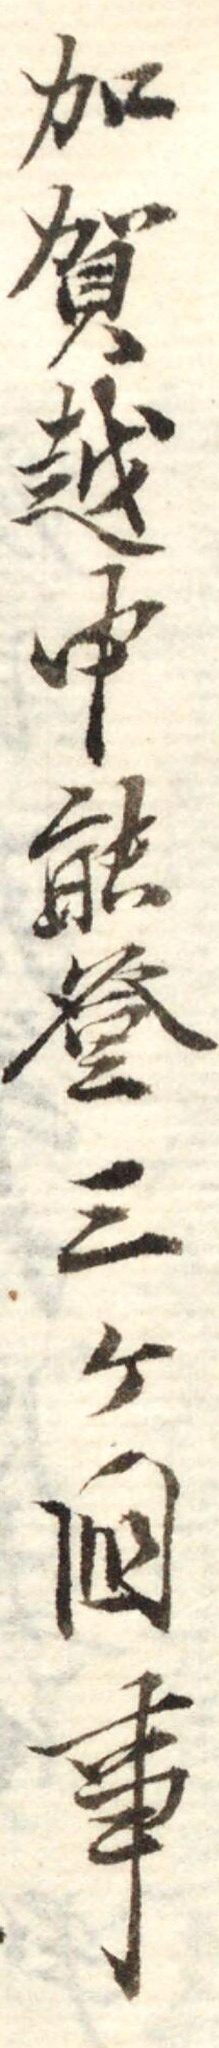加賀越中能登三け国事
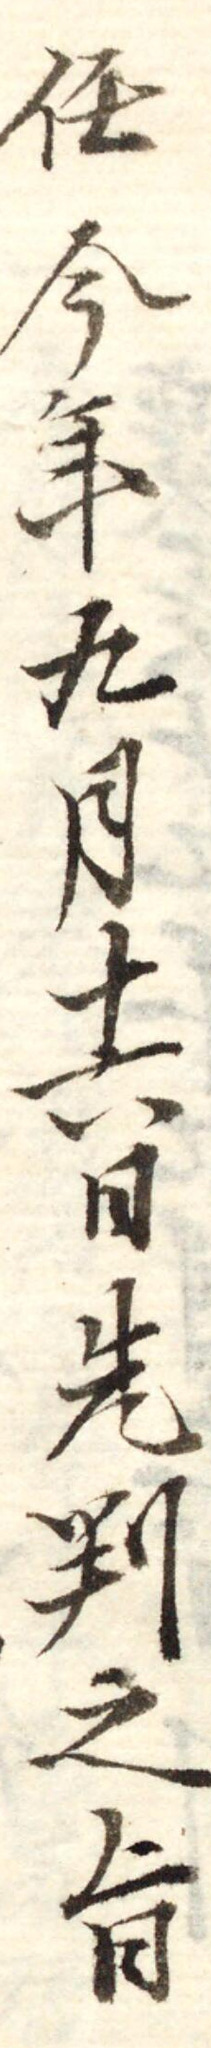任今年九月十六日先判之旨
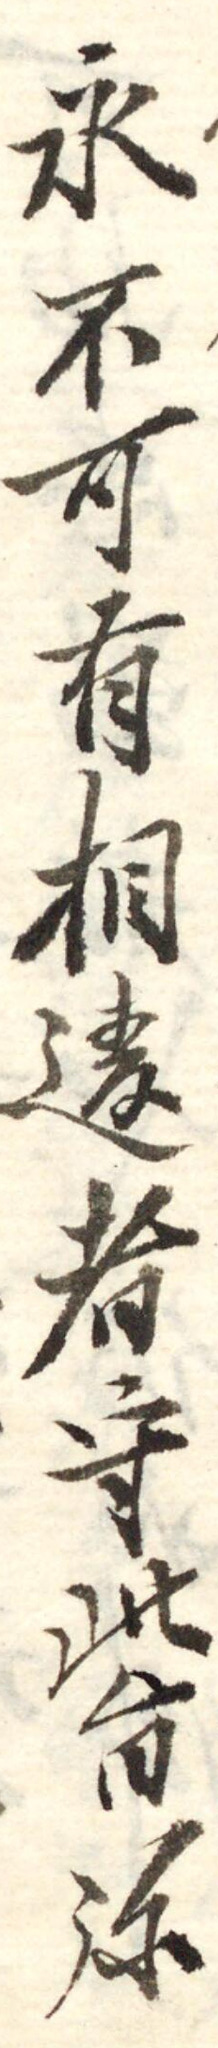永不可有相違者守此旨弥
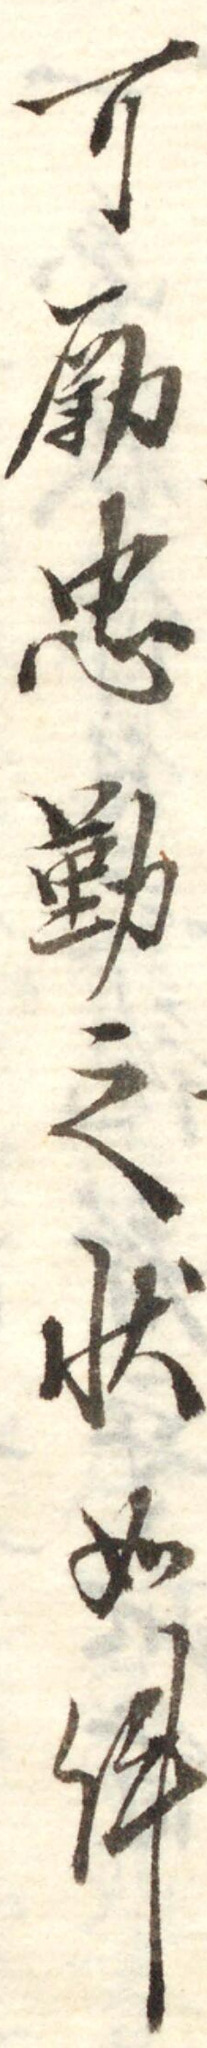可励忠勤之状如件
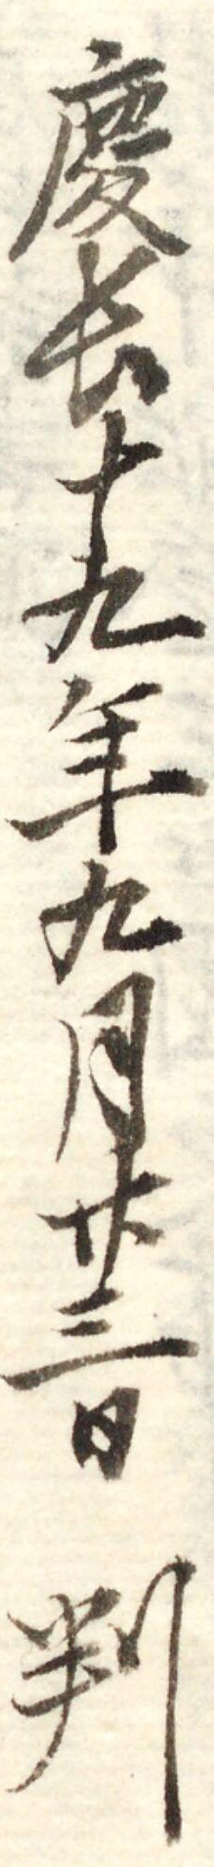慶長十九年九月廿三日判
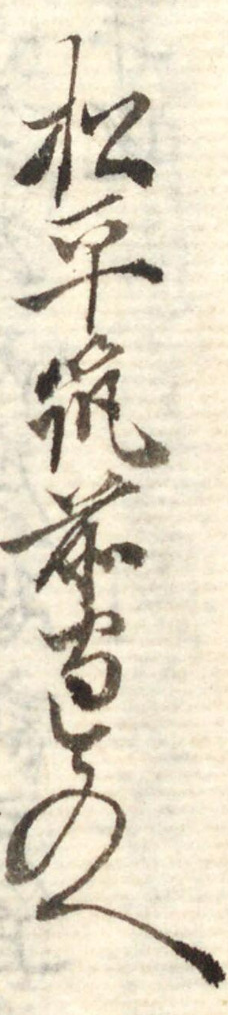松平筑前守とのへ
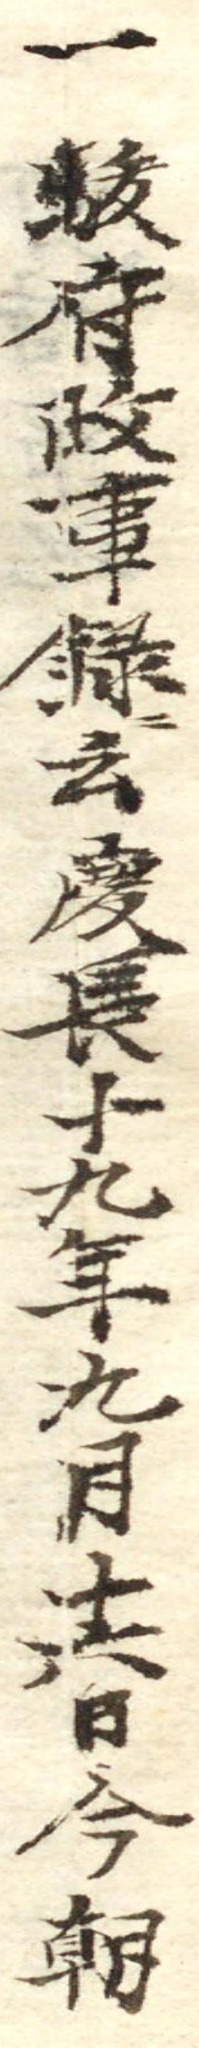一駿府政事録に云慶長十九年九月十六日今朝
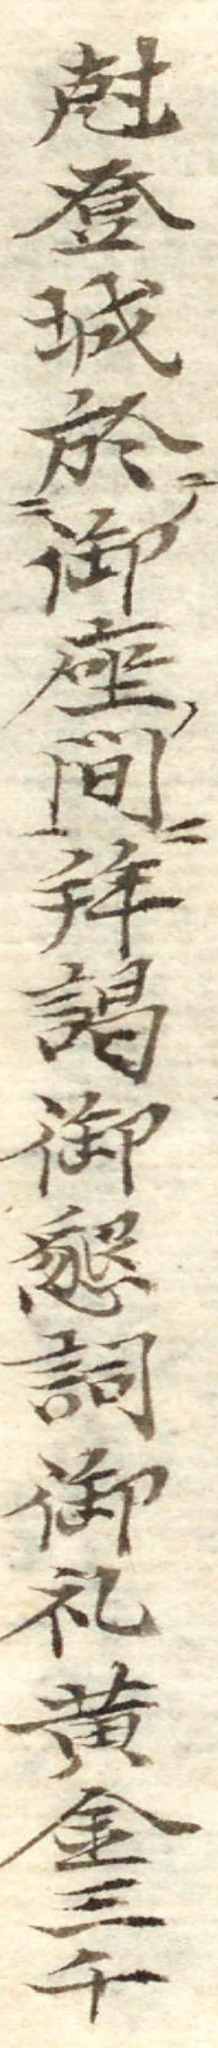尅登城於て御座の間に拝謁御懇詞御礼黄金三千
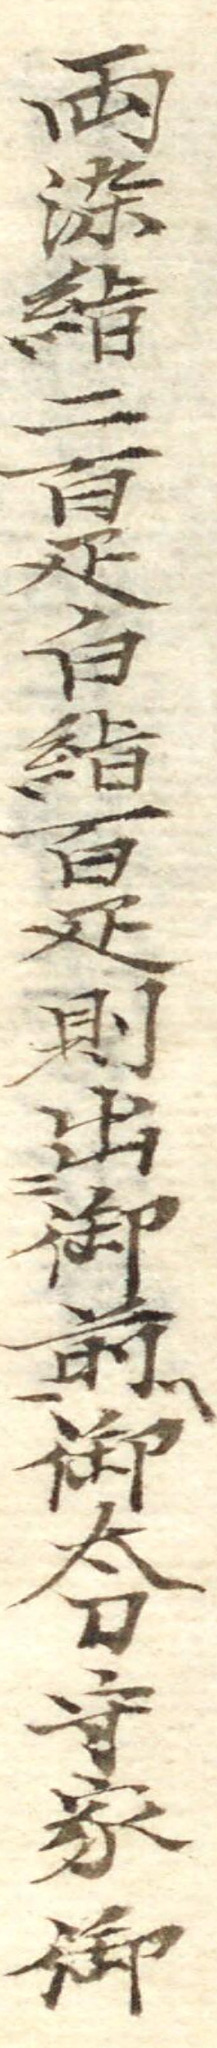両染絹二百疋白絹百疋則出御前へ御太刀守家御
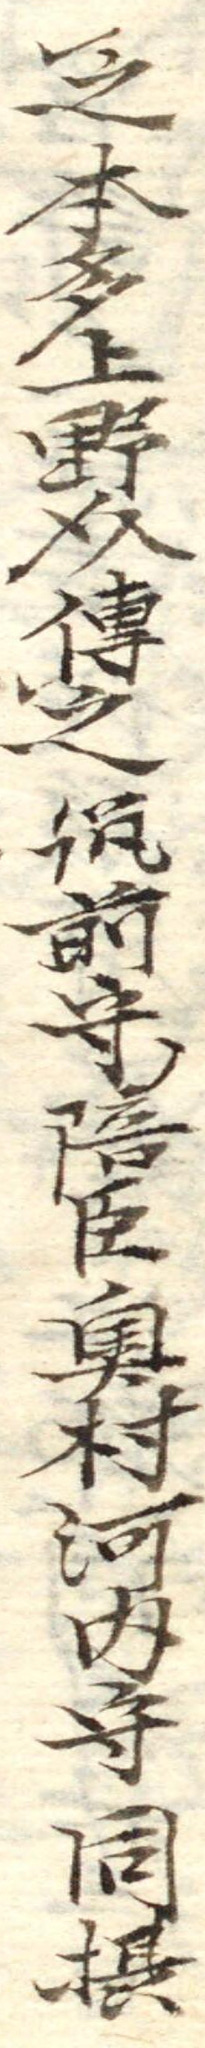ㇾ之本多上野介傳之筑前守之陪臣奥村河内同摂
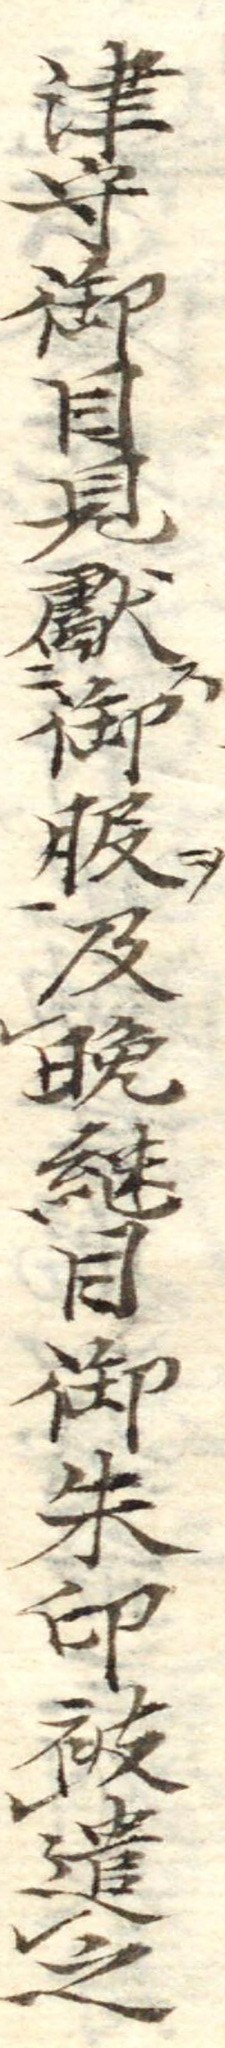津守御目見獻す御服を及晩継目御朱印被遣之
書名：前田家封国証書集録
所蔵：Ishikawa Prefectural Library
